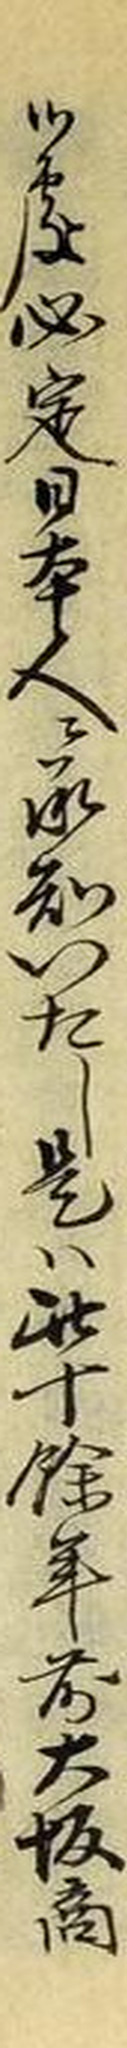候処必定日本人ニ承知いたし是ハ此十余年前大坂商
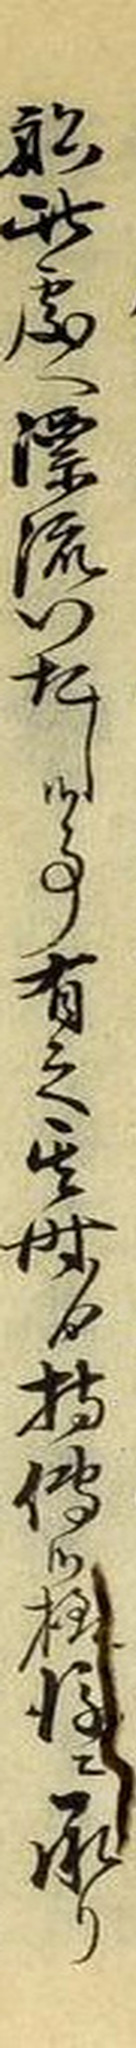船此処へ漂流いたし候事有之其時ゟ持伝候様後ニ承り
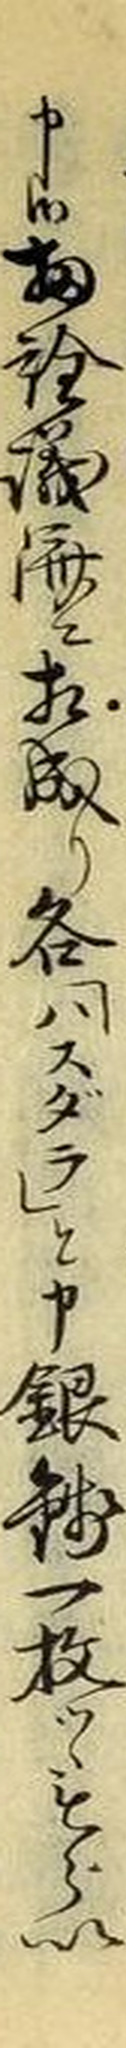申候扨詮議済ニ相成り各「ハスダラ」と申銀銭一枚ツヽもらい
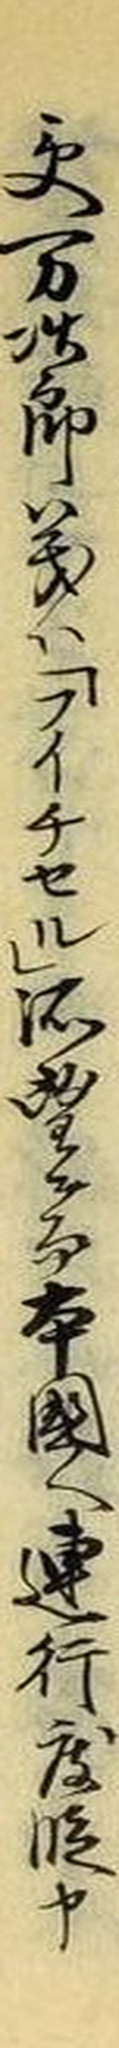受万次郎義ハ「フイチセル」所望ニ而本国へ連行度段申
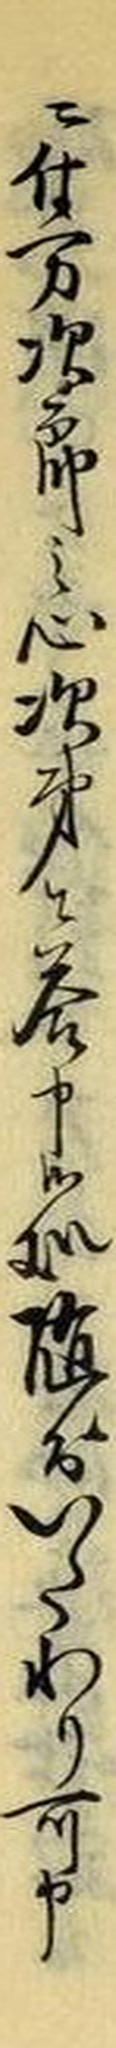ニ付万次郎之心次第と答申候処随分いたわり可申
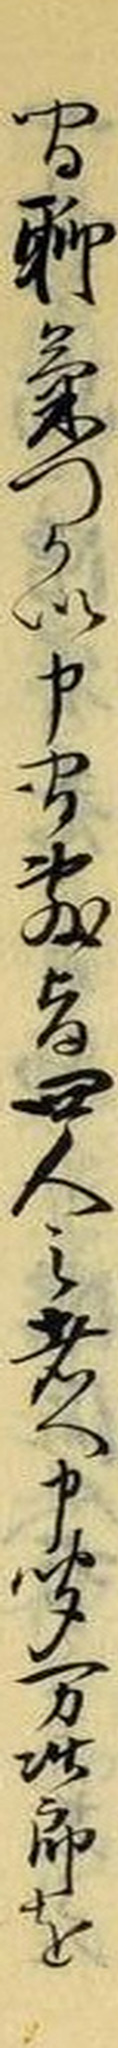間聊気つかい申間敷旨四人之者へ申聞万次郎を
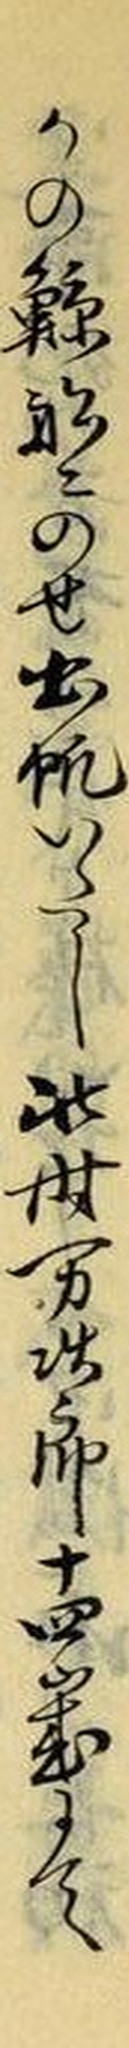かの鯨船ニのせ出帆いたし此時万次郎十四歳にて
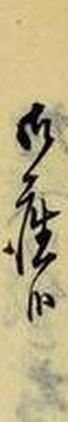御座候
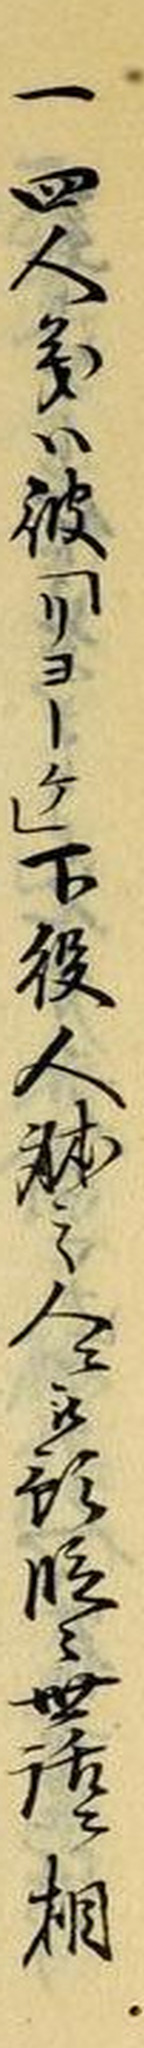一四人義は彼「リヨーケ」下役人体之人に被預段〻世話に相
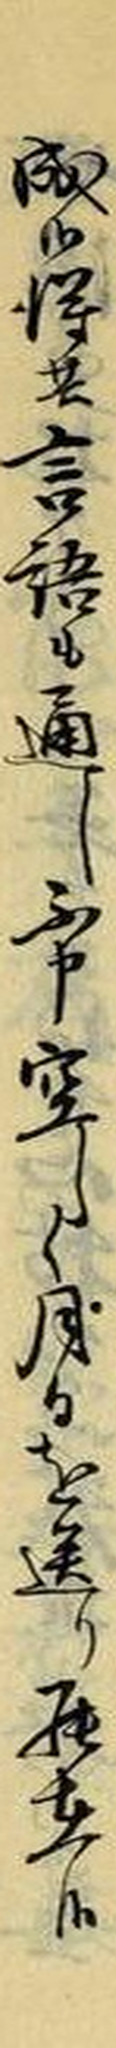成候得共言語も通し不申空しく月日をおく送り罷在候
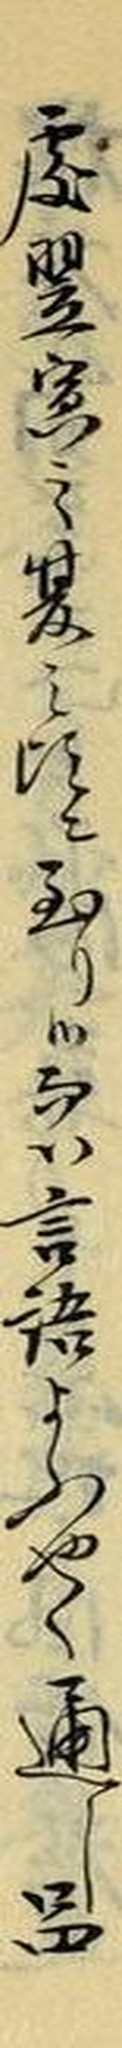処翌寅之夏之頃に至り候而は言語よふやく通し品
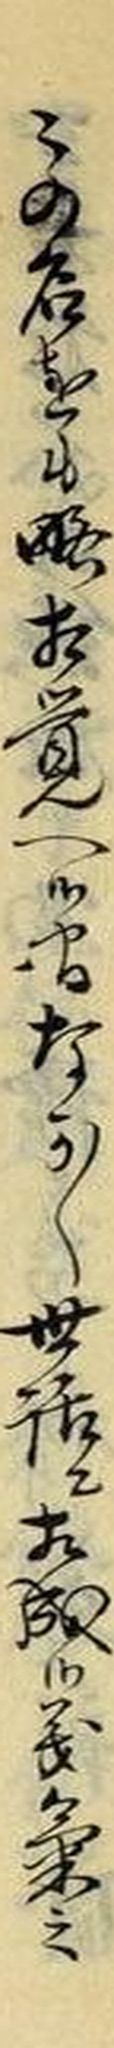〻の名をも略相覚へ候間なか〳〵世話に相成候義気之
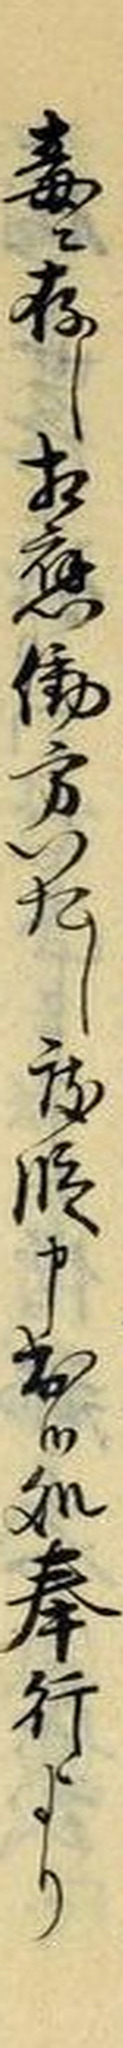毒に存し相応働方いたし度段申出候処奉行より
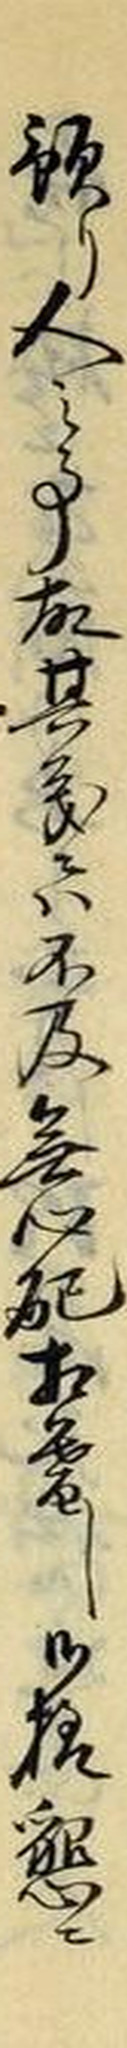預り人之事故其義には不及無心配相暮し候様懇に
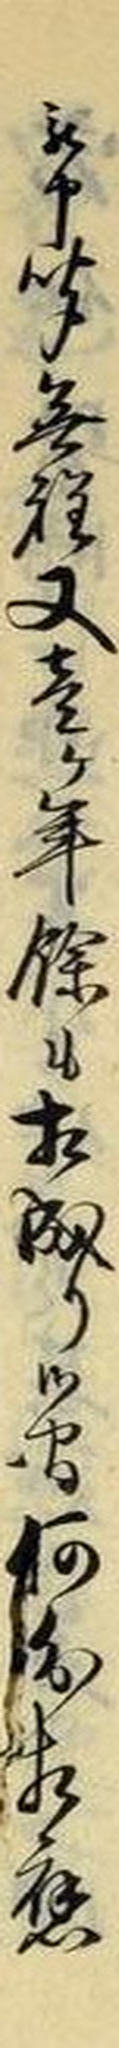被申聞無程又壱ヶ年余も相成り候間何分相応
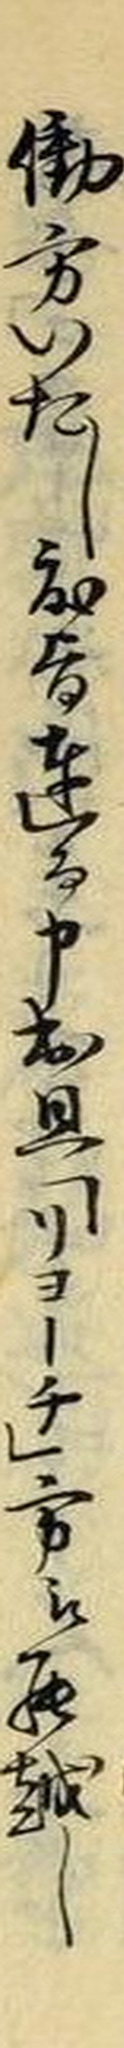働方いたし度旨達而申出且「リヨーチ」方江罷越し
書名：漂客談奇（備考雑録写8）
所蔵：福井県文書館 Fukui Prefectural Archives
